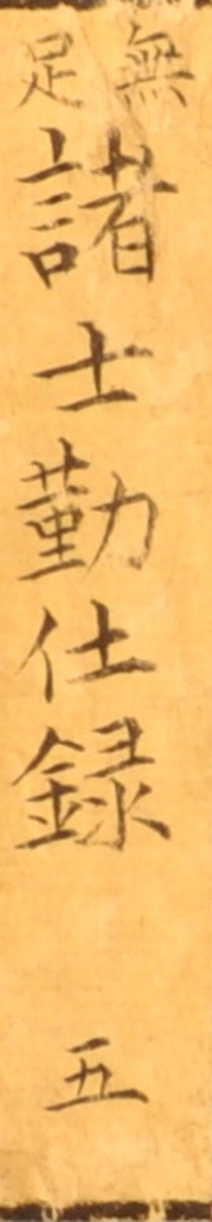無諸士勤仕録五

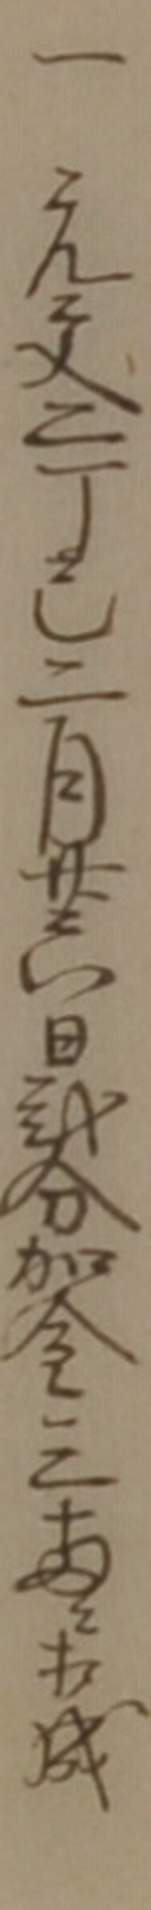一元文二丁巳二月廿六日弐分加金三両ニ相成
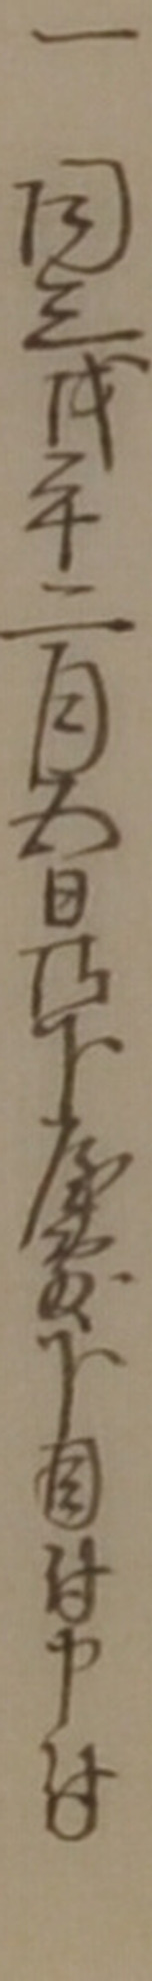一同三戊午二月五日御下屋敷下目付申付
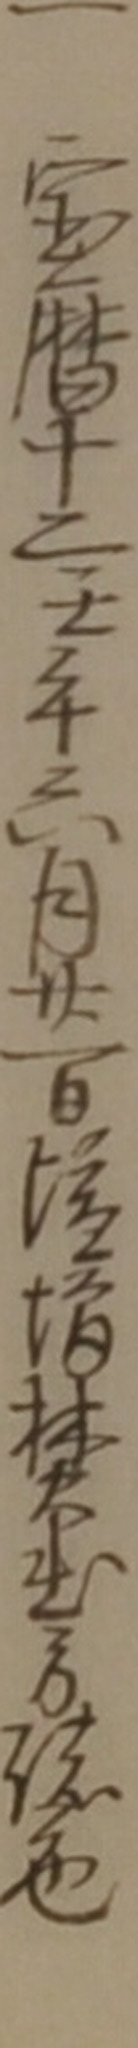一宝暦十二壬午六月廿一日塩硝焚出方諸色
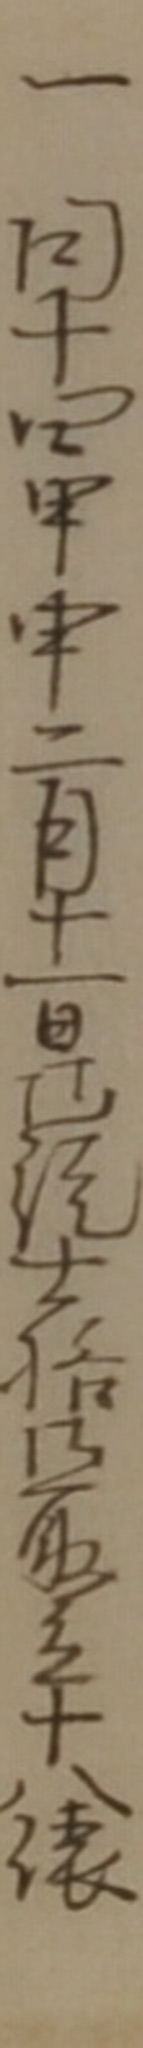一同十四甲申二月十一日御徒士格御取立十八俵
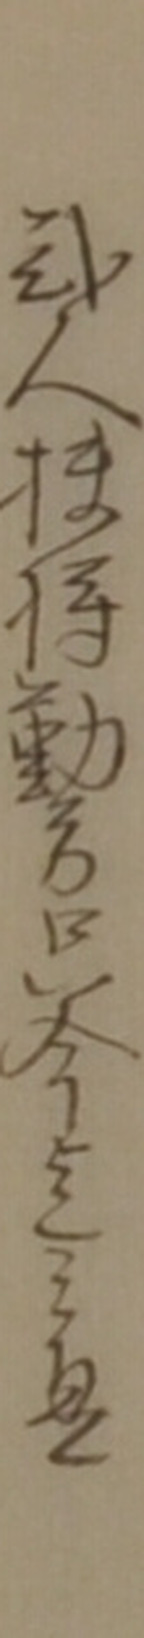弐人扶持勤方只今迄之通
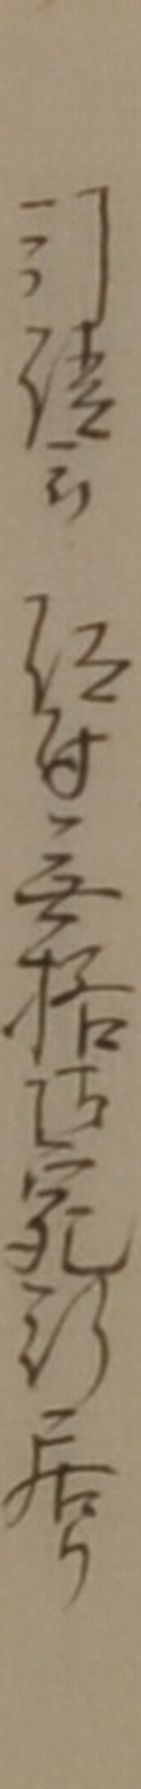引請被仰付無格御宛行居リ
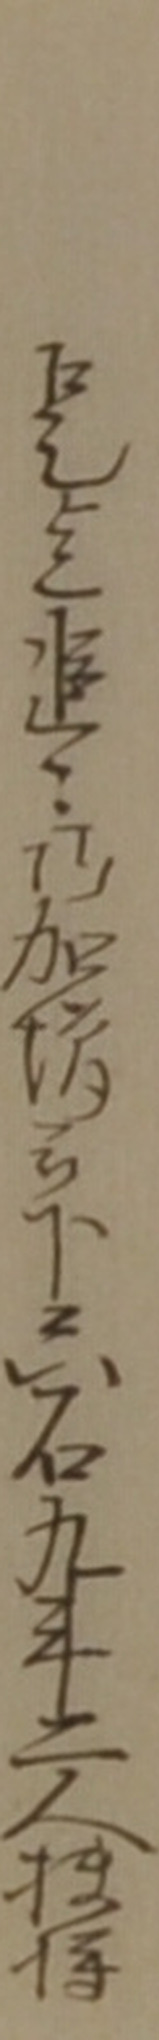是迄追々御加増被下六石九斗二人扶持
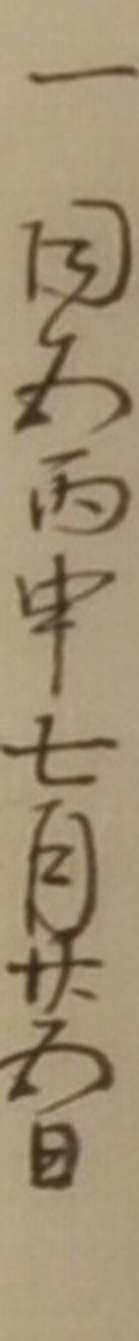一同五丙申七月廿五日
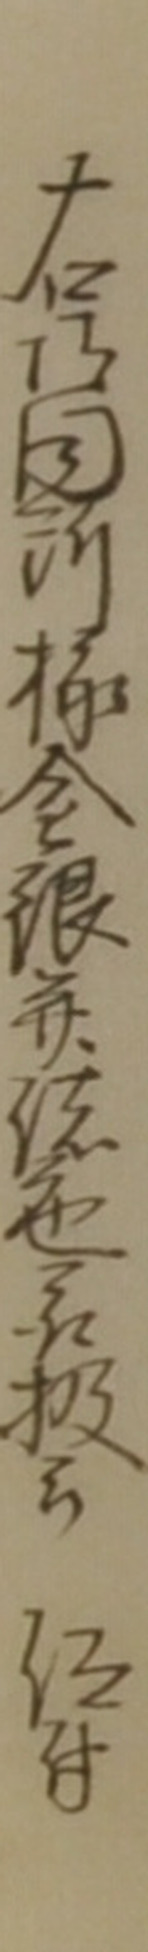右御同所様金銀并諸色取扱被仰付
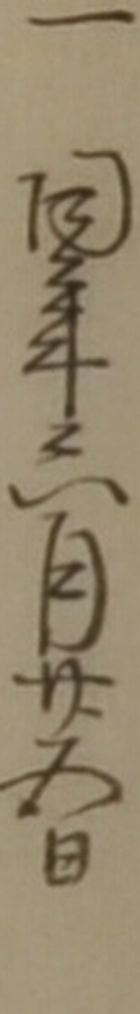一同年六月廿五日

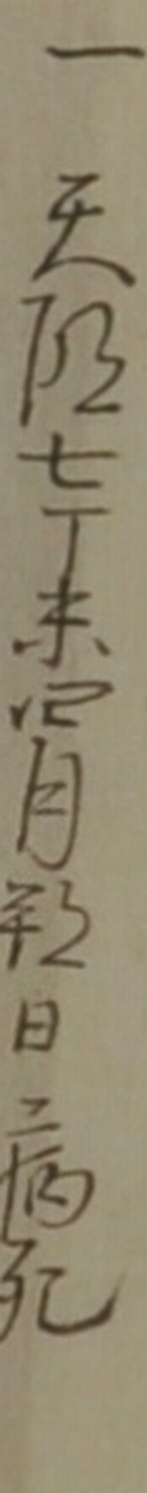一天明七丁未四月朔日病死
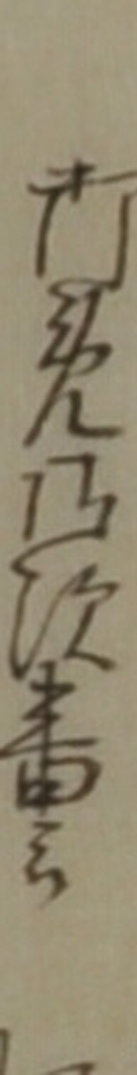御免御次番被仰付
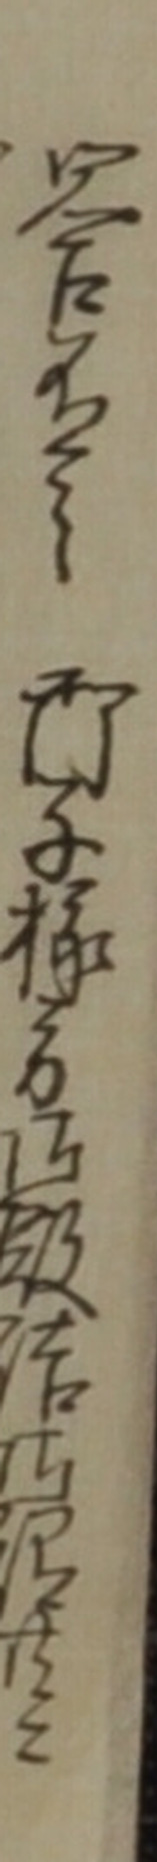思召有之御子様方御殿詰御賄共ニ
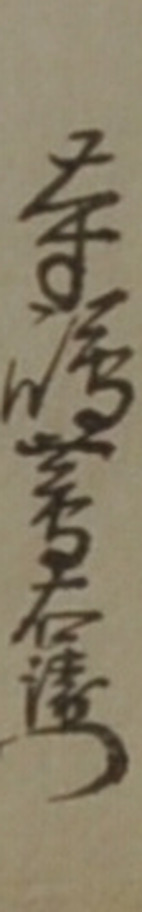寺嶋蔦右衛門
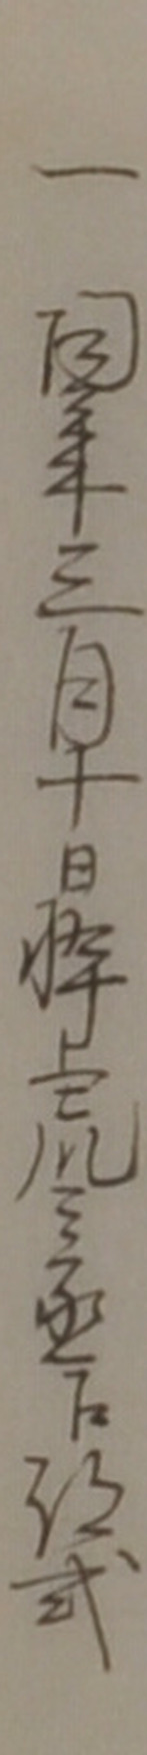一同年三月十日伜虎之丞江跡式
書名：無足諸士勤仕録（五）
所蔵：伊那市立高遠町図書館・合同会社AMANE
